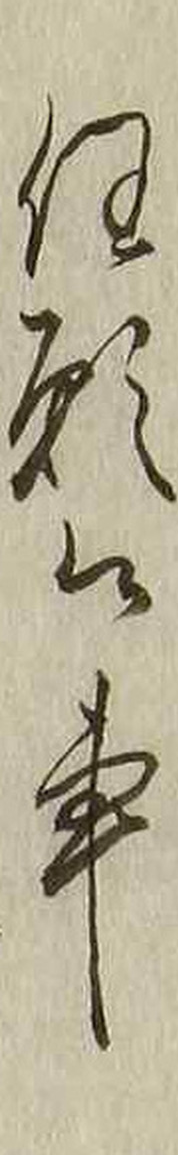任願候事
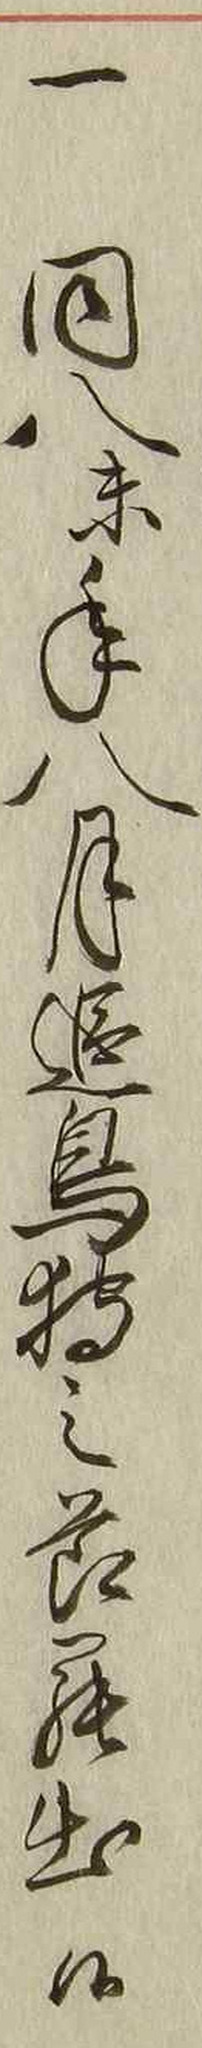一同八未年八月追鳥狩之節罷出候
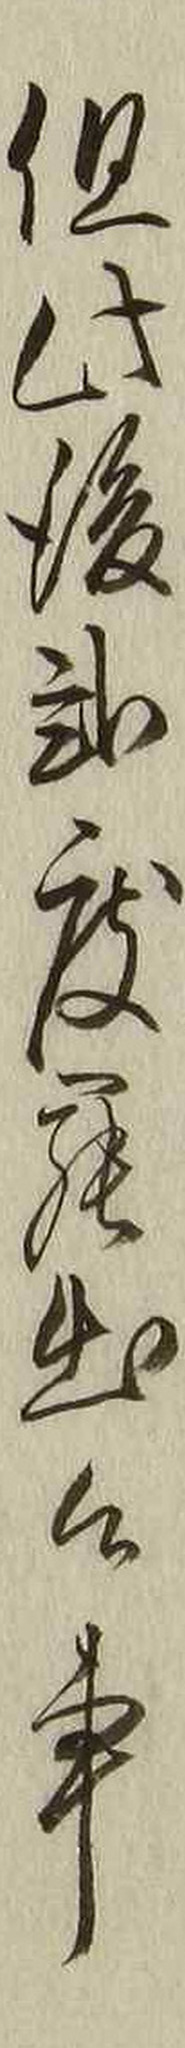但此後弐度罷出候事
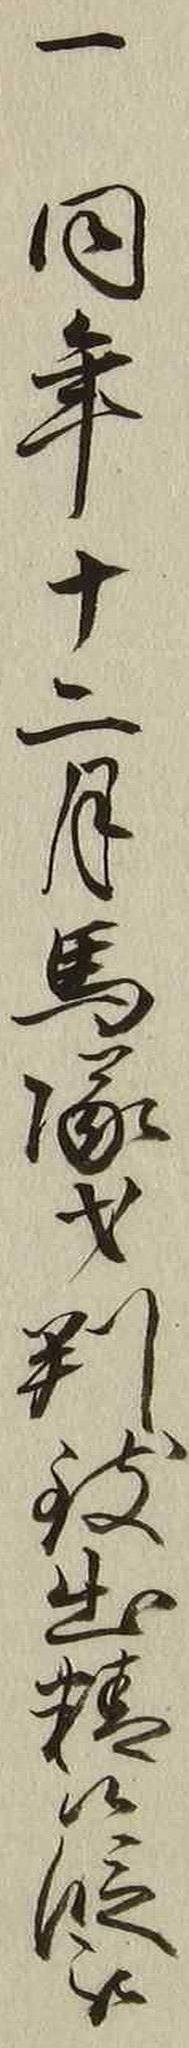一同年十二月馬隊才判致出精候段被
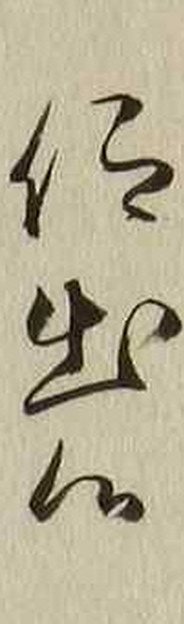仰出候
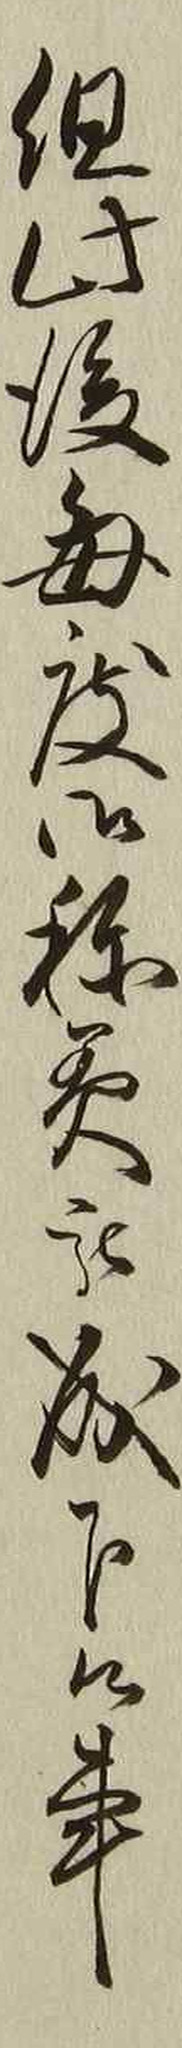但此後毎度御称美被成下候事
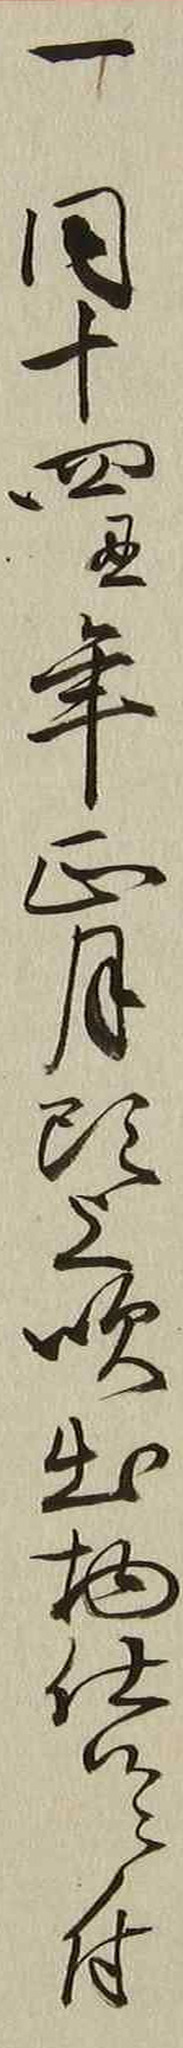一同十四丑年正月頭上吹出物仕候ニ付
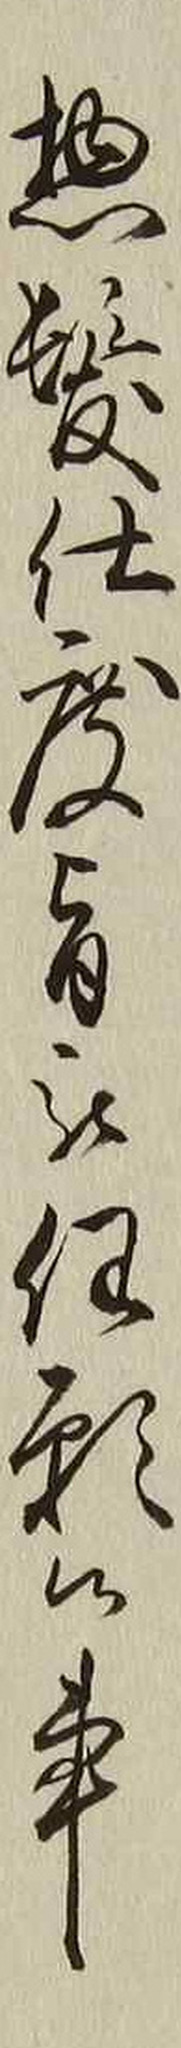惣髪仕度旨被任願候事
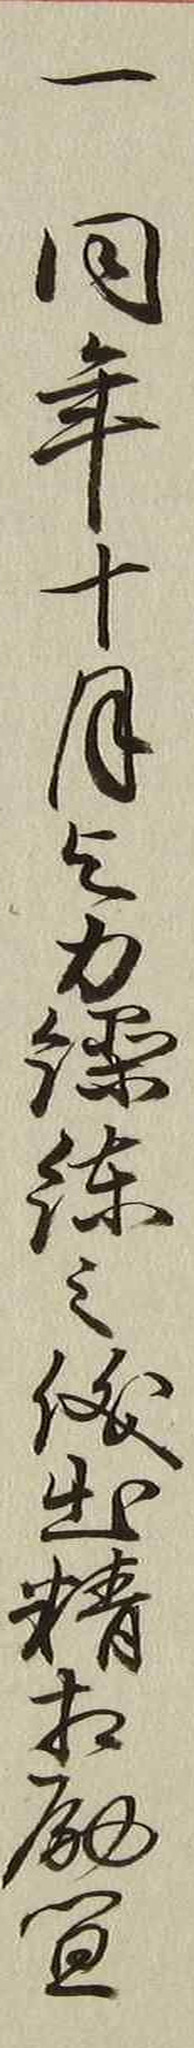一同年十月与力繰練之儀出精相励宜
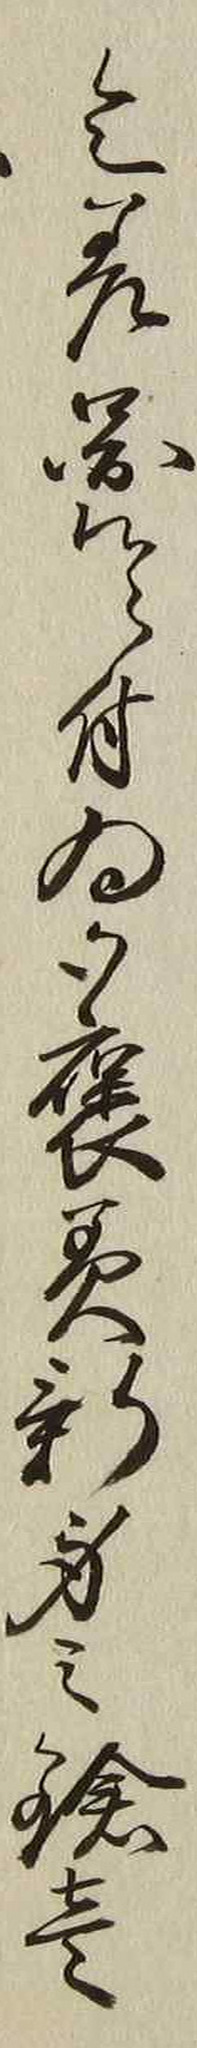令差図候ニ付為御褒美新身之鎗壱
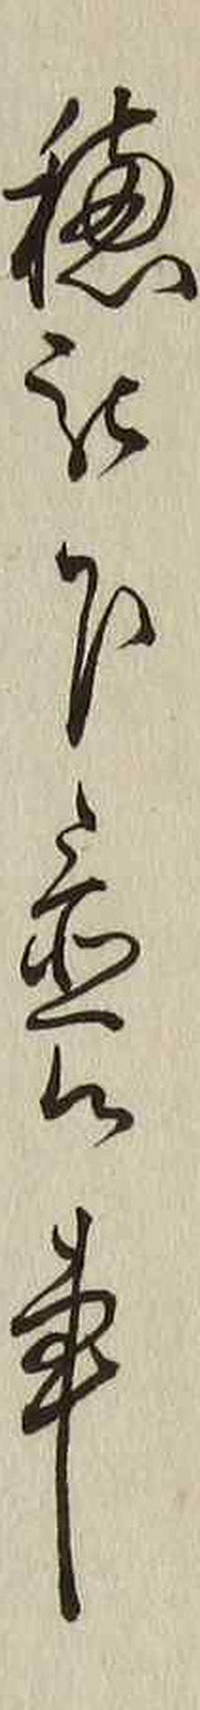穂被下置侯事
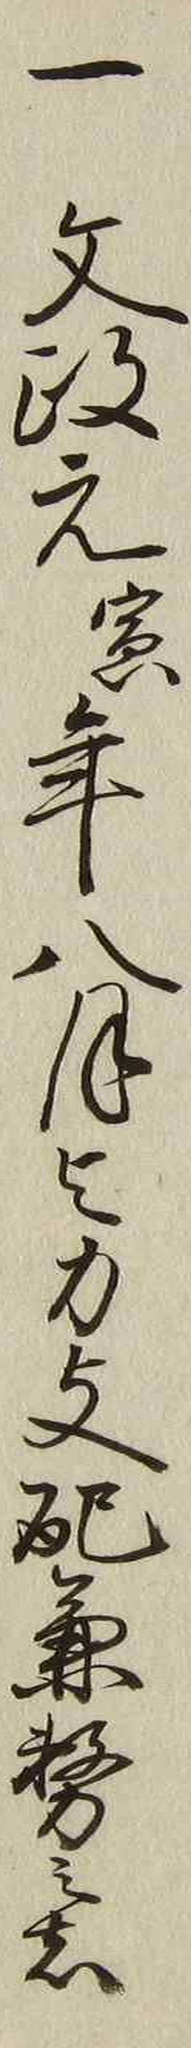一文政元寅年八月与力支配兼務之者
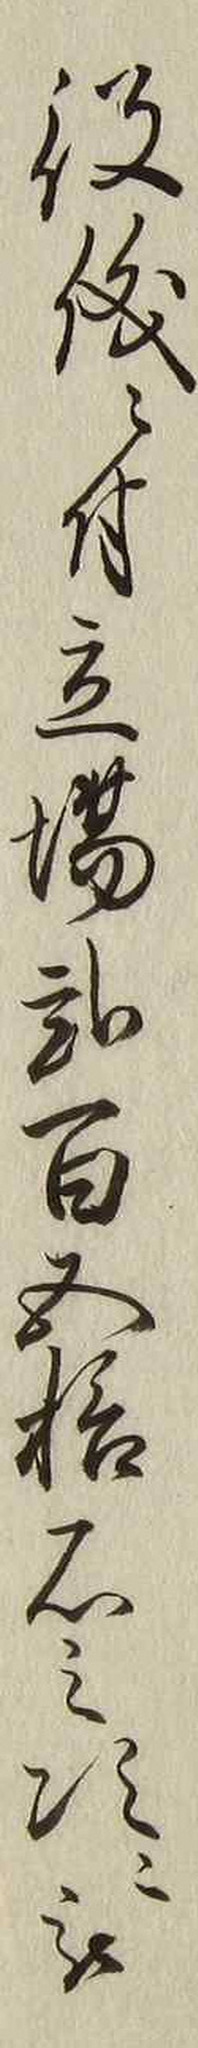役儀ニ付立場弐百五拾石之次ニ被
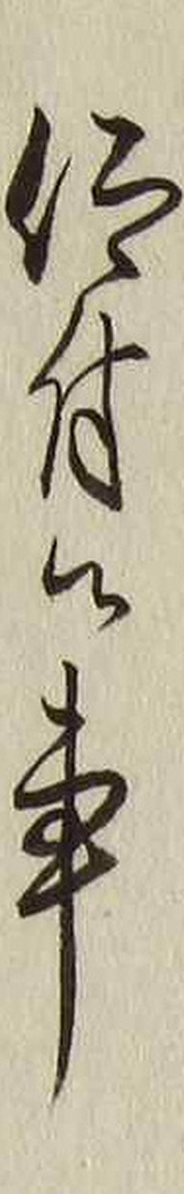仰付候事
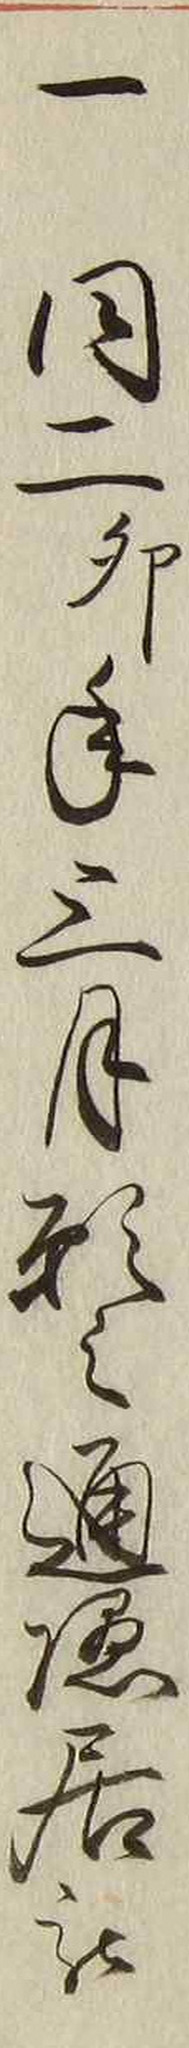一同二卯年三月願之通隠居被
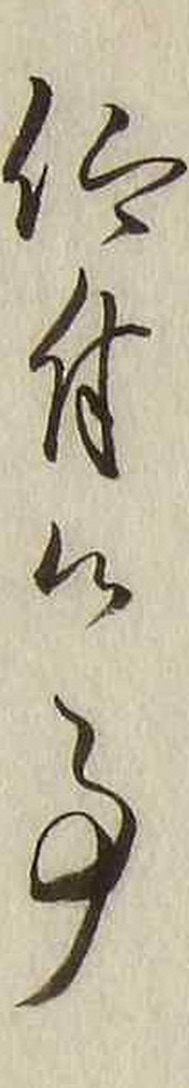仰付候事
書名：諸士系譜　巻之21　い之部21
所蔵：会津若松市立会津図書館
